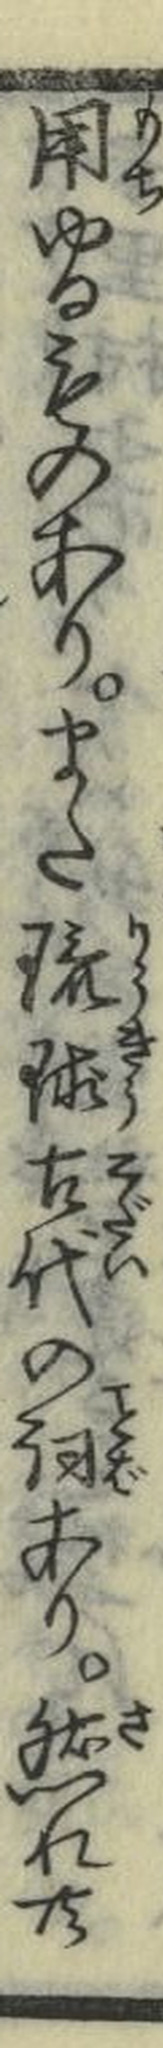用ゆるものあり。また琉球古代の詞あり。然れ共
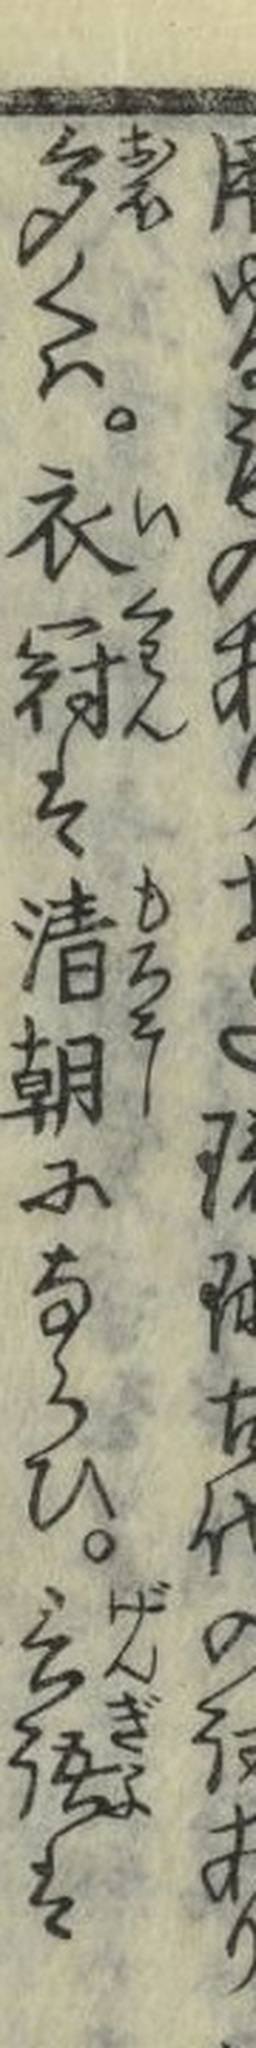多くは。衣冠は清朝にならひ。言語は
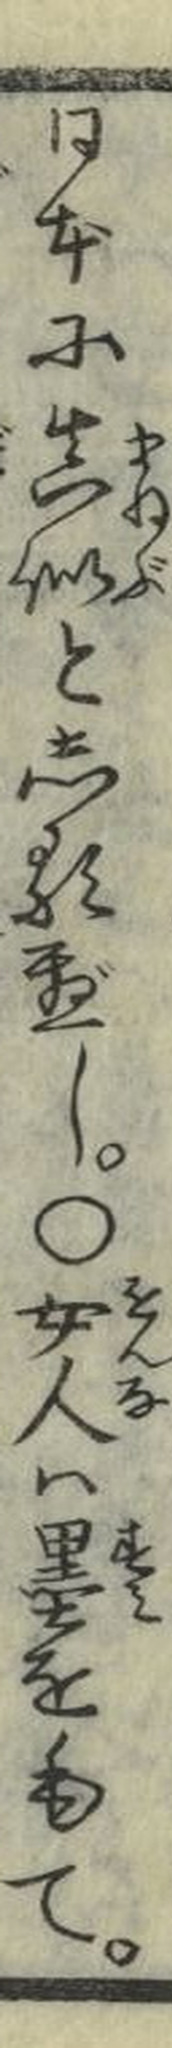日本に真似としるべし。○女人は墨をもて。
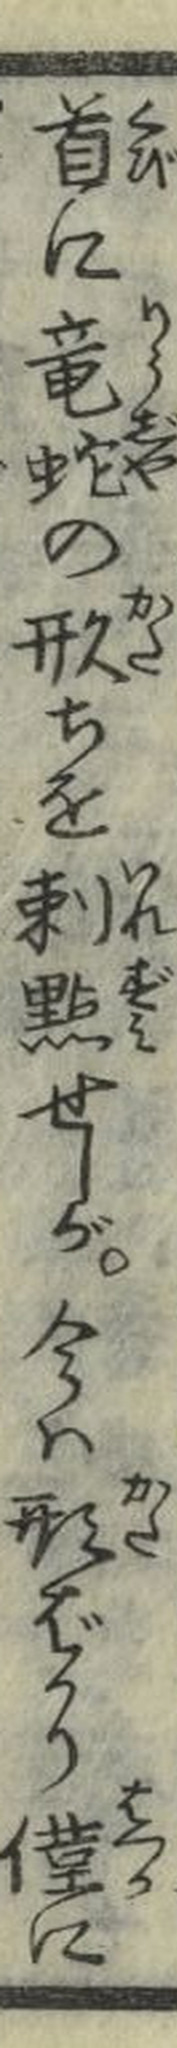首に竜蛇の形ちを刺点せしが。今は形ばかり僅に
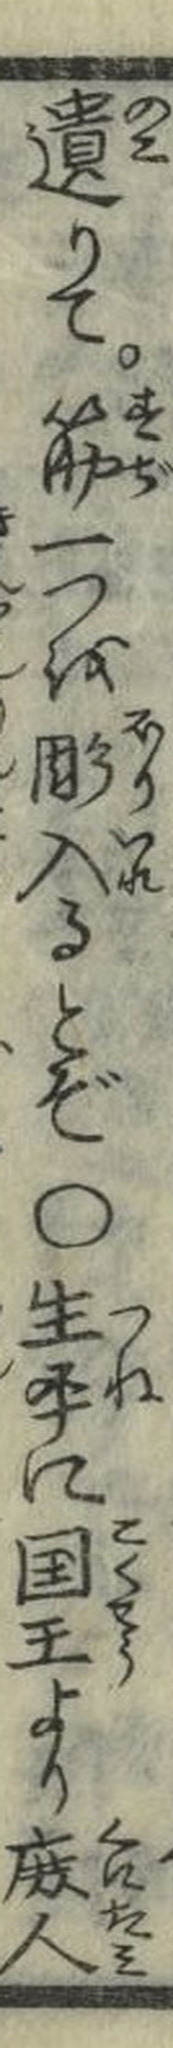遺りて。筋一つ彫入るとぞ○生平に国王より庶人
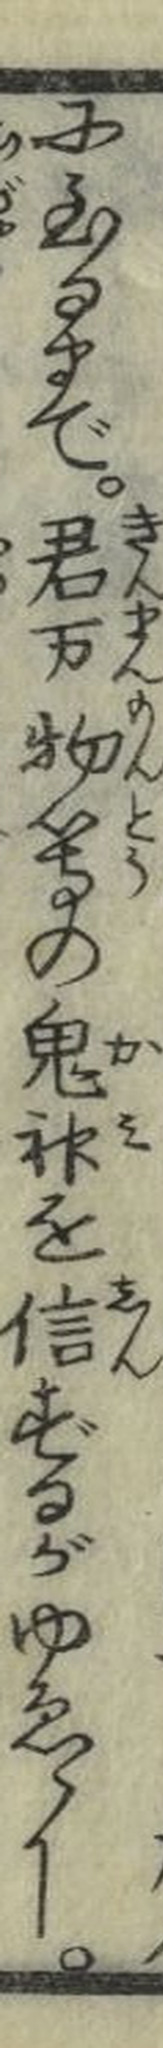に至るまで。君万物等の鬼神を信ずるがゆゑに。
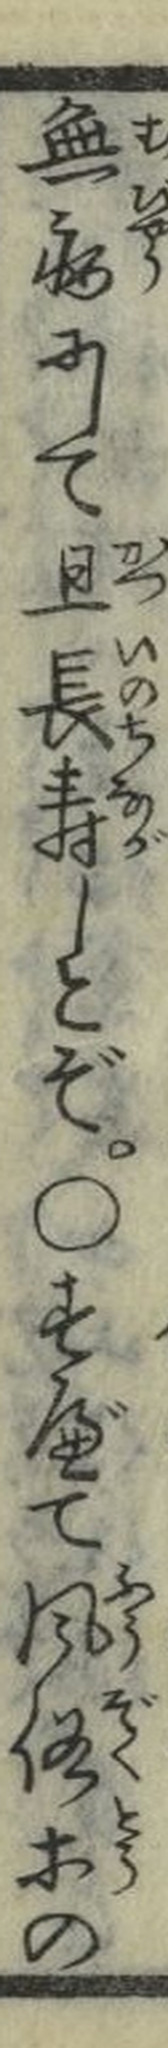無病にして且長寿しとぞ。○すべて風俗等の

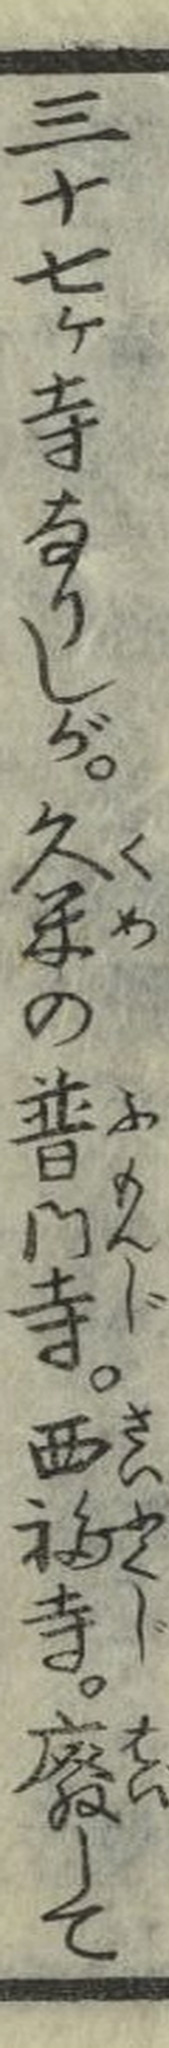三十七ヶ寺なりしが。久米の普門寺。西福寺。廃して
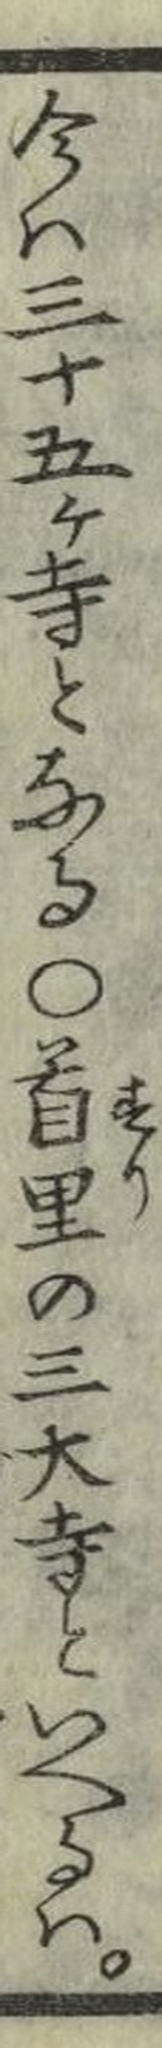今は三十五ヶ寺となる○首里の三大寺といへるは。
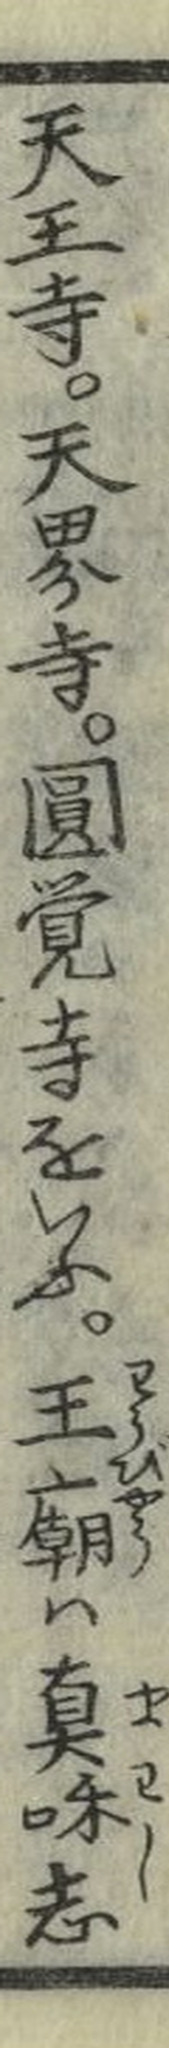天王寺。天界寺。円覚寺をいふ。王廟は真味志
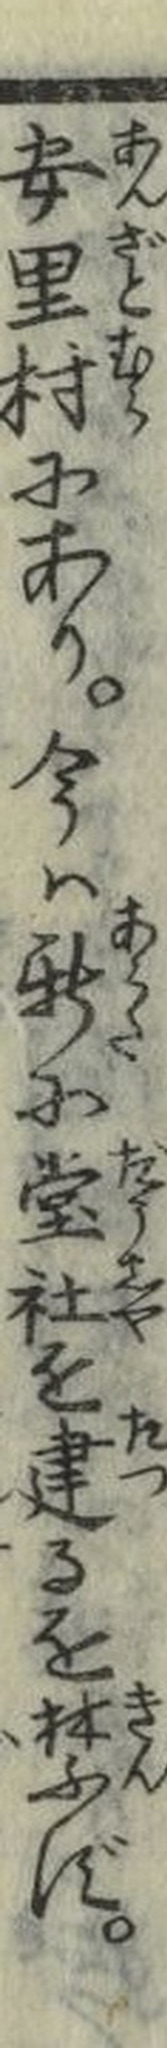安里村にあり。今は新に堂社を建るを禁ず。
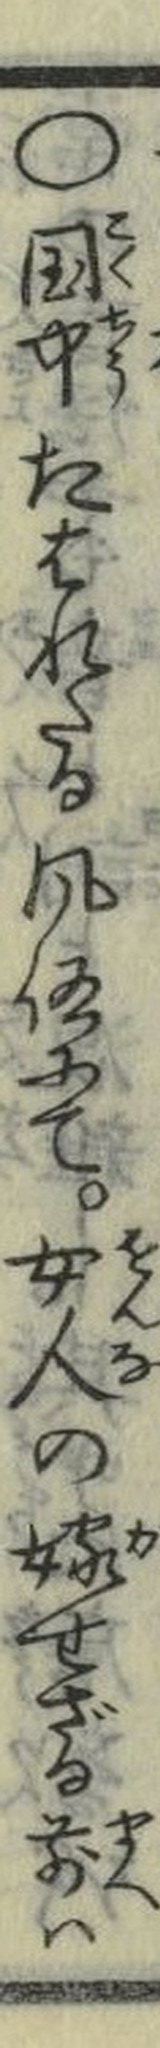○国中たはれたる風位にて。女人の嫁せざる前は
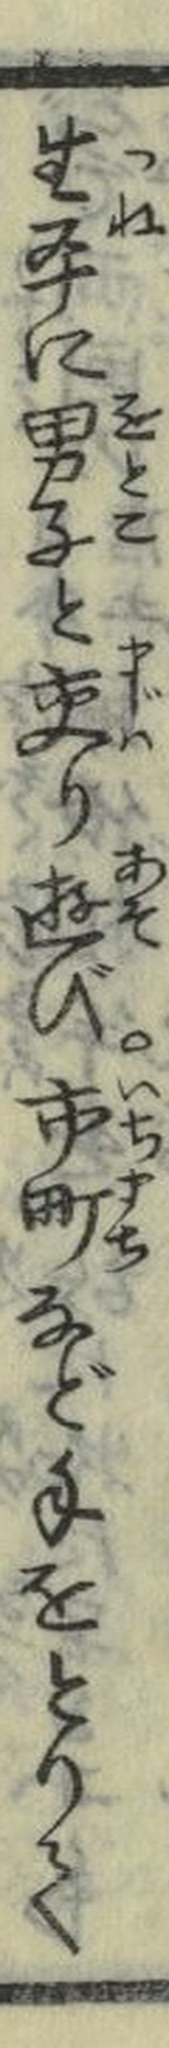生平に男子と交り遊び。市町など手をとりて
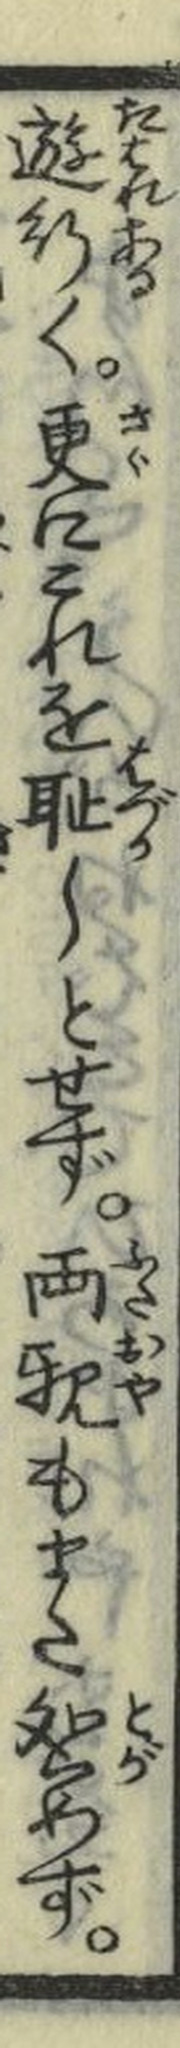遊行く。更にこれを恥しとせず。両親もまた咎めず。
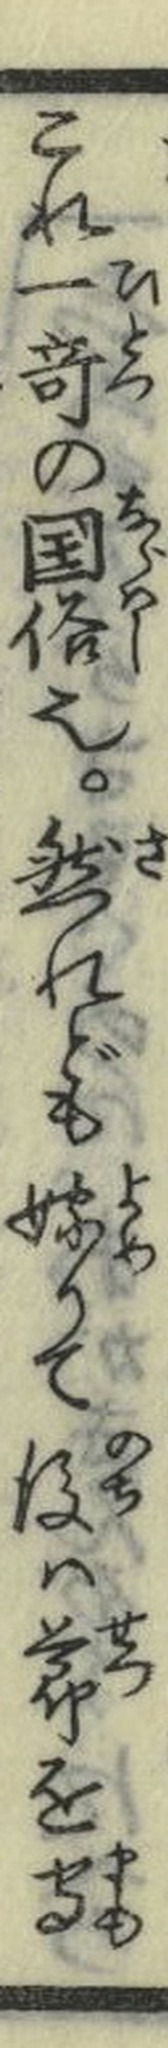これ一奇の国俗也。然れども嫁りて後は節を守
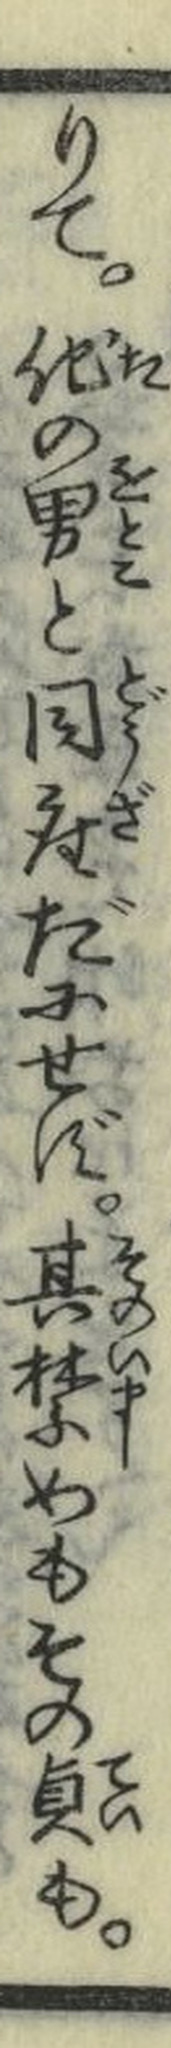りて。他の男と同座だにせず。其禁めもその貞も。
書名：琉球奇譚
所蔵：University of the Ryukyus Library
